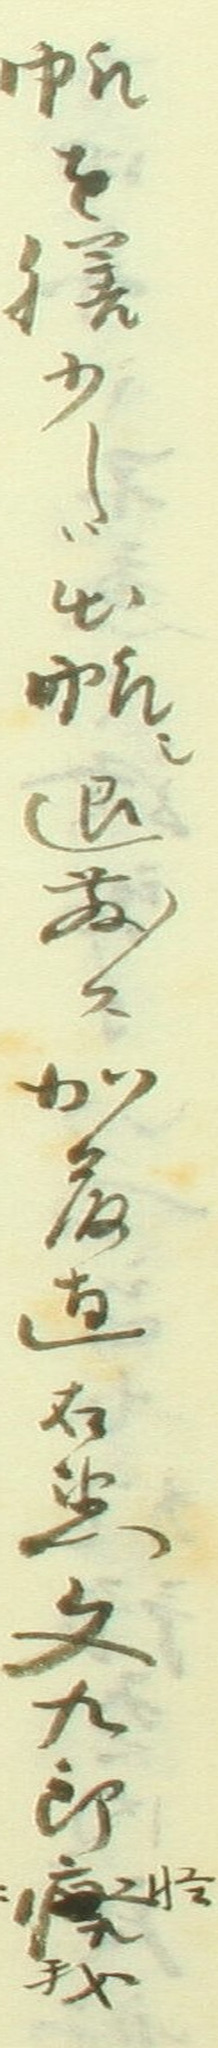帆を？少しは出帆し退敷す加藤直右衛門文九郎廃我
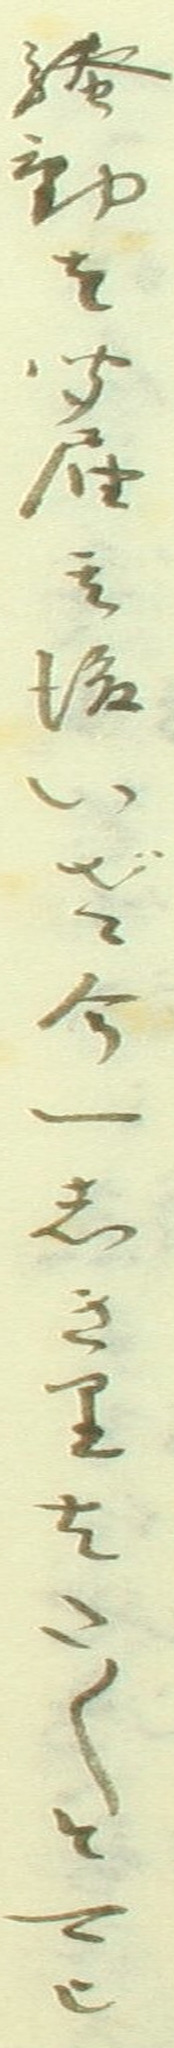験動を聞届其後いざ今一志きりはたはたと可被
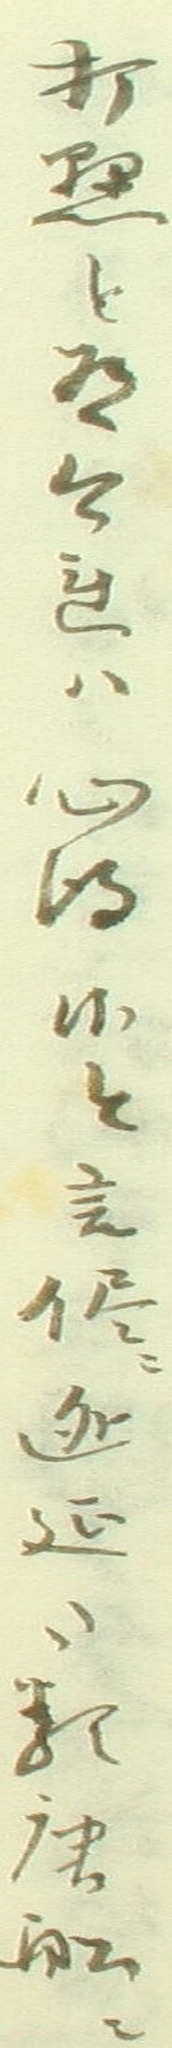打懸と有けれは心得候と言う侭に逃延たる唐船に
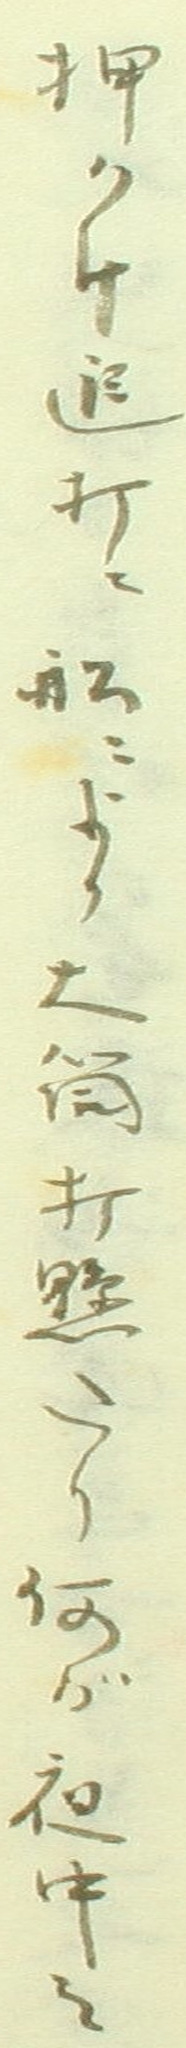押かけ追打に船により大筒打懸たり何が夜中之
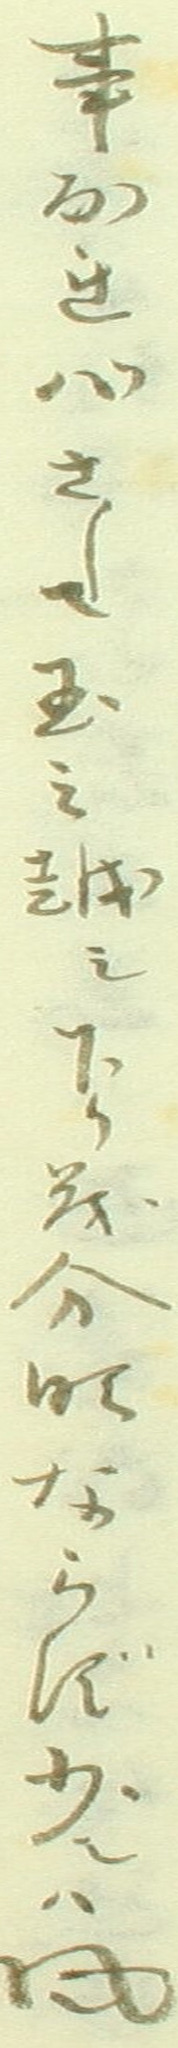事なればさして玉之越し下りも分明ならず少しは風
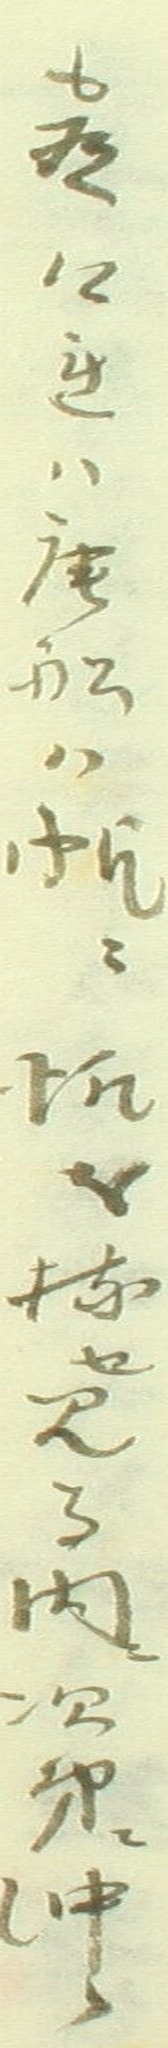も有けれは唐船は帆に帆を持せ見る内に次第に沖へ
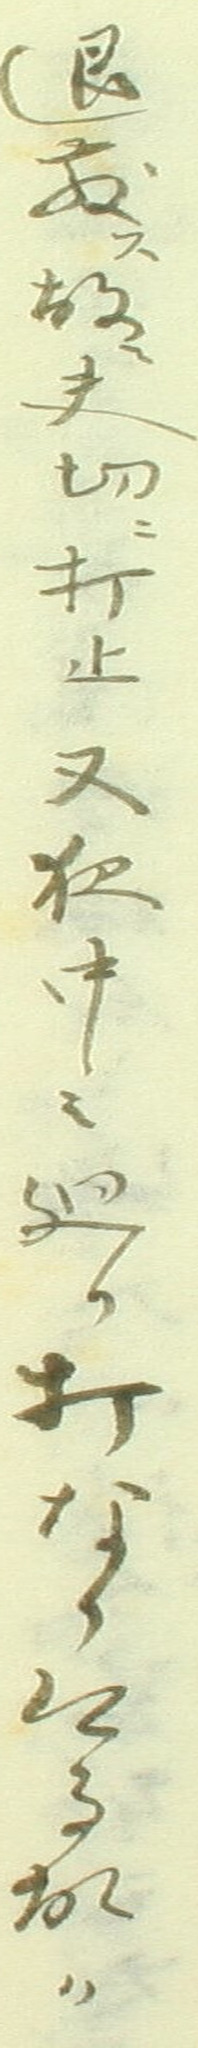退敷す故に夫切に打止又夜中に廻り打なりける故は
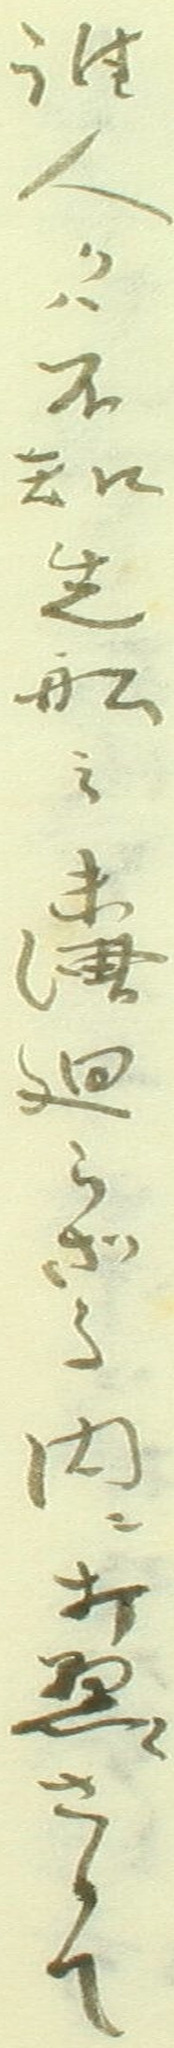誰人りは不知先船之未漕廻らざる内に打ち懸候さりて
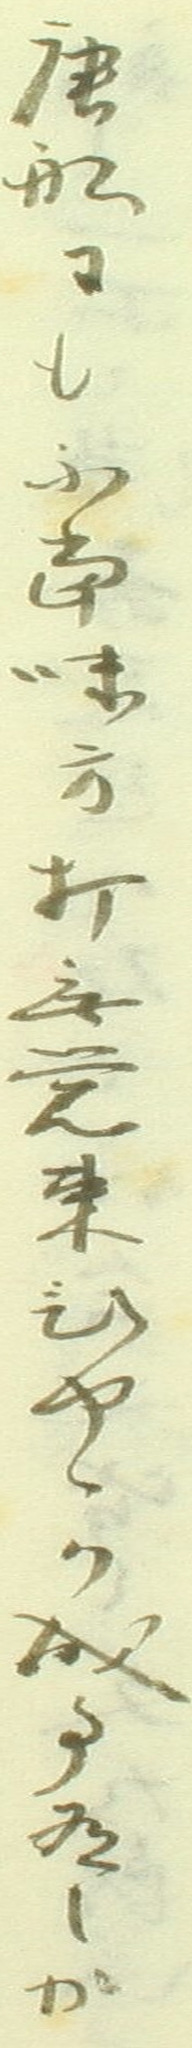唐船にも不当味方打無覚束ひややか成事有しか
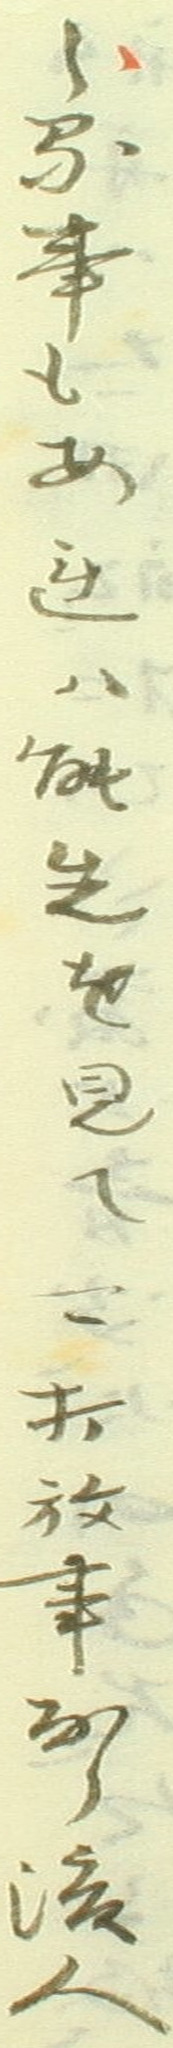し累事もあれは能先を見て可打放事なら渡人
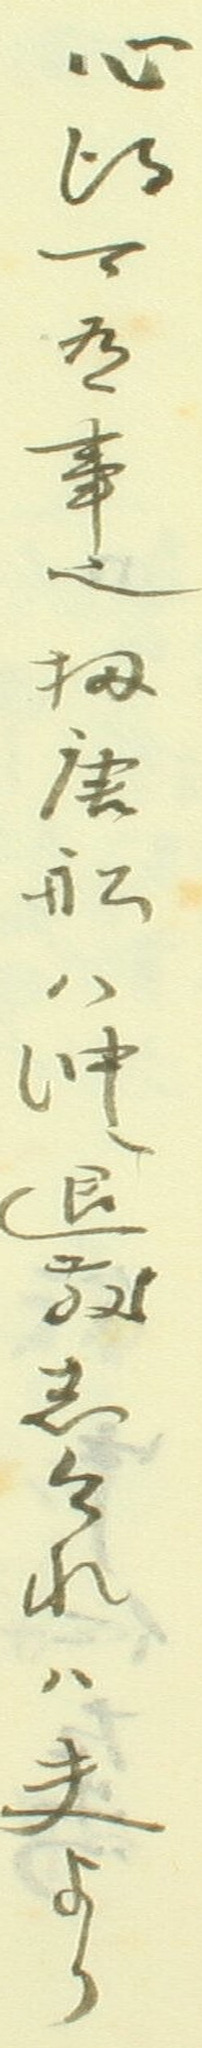心得可有事也扨唐船は沖へ退敷しけれは夫より
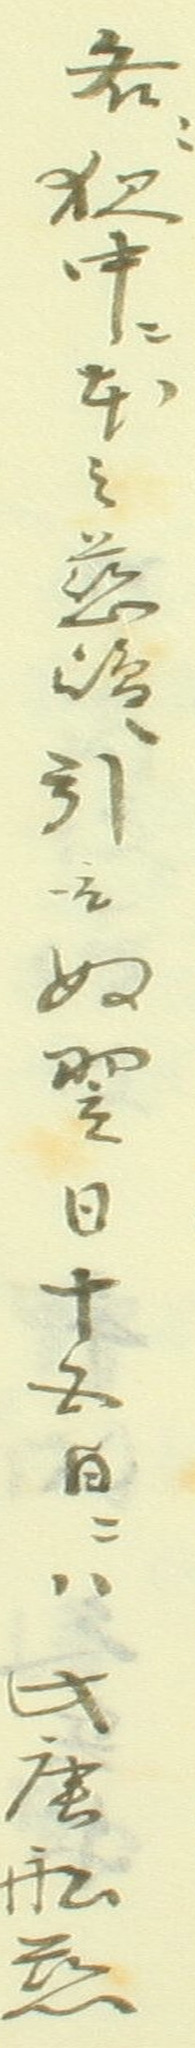各々夜中に本之慈嶋へ引取ぬ翌日十五日には此唐船慈
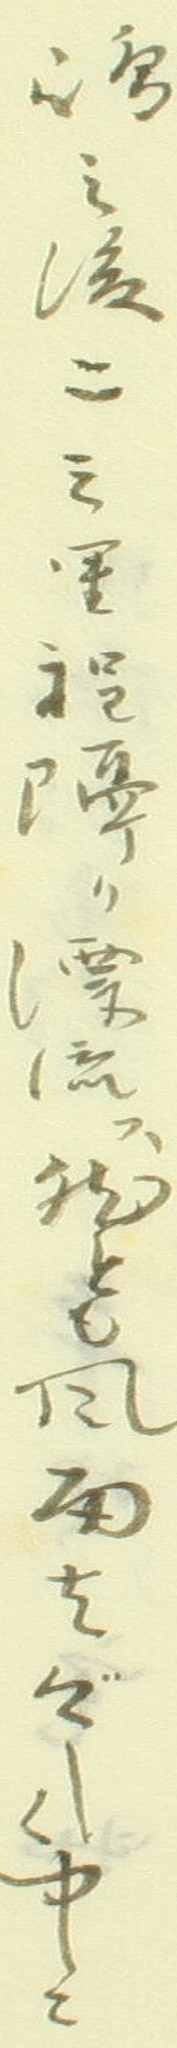嶋之後二三里程隔り漂流す然とも風雨はげしく中々
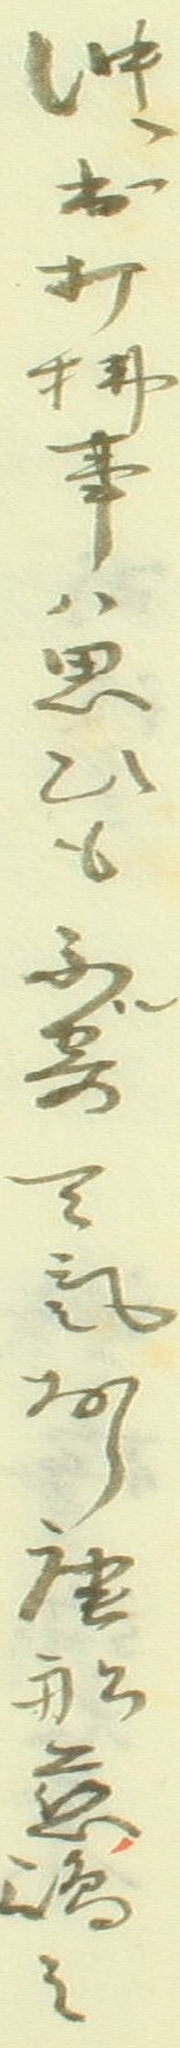沖へ出打払事は思ひも不る寄天気なり唐船慈嶋之
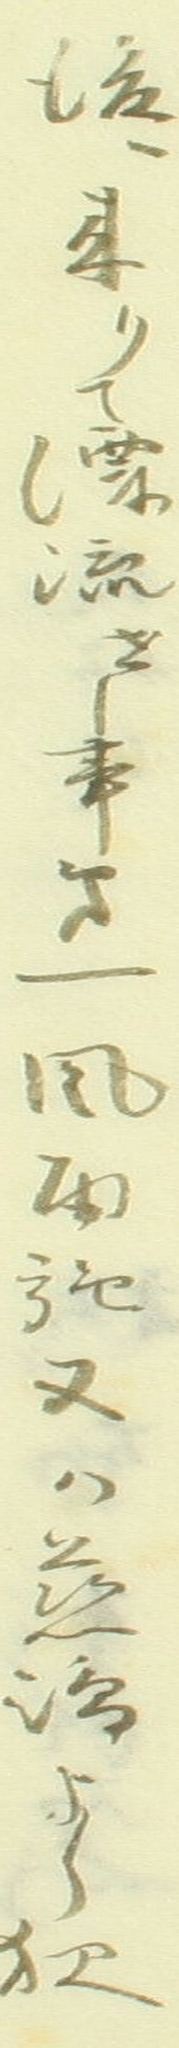後へ来りて漂流せし事万一風雨絶又は慈嶋より夜
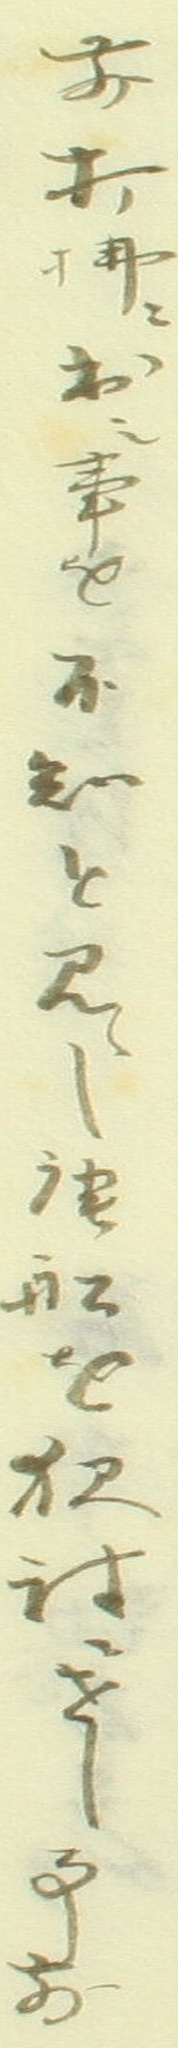前打払に出之事を不知と見へし唐船を夜討にせし事前
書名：唐船漂流記 三
